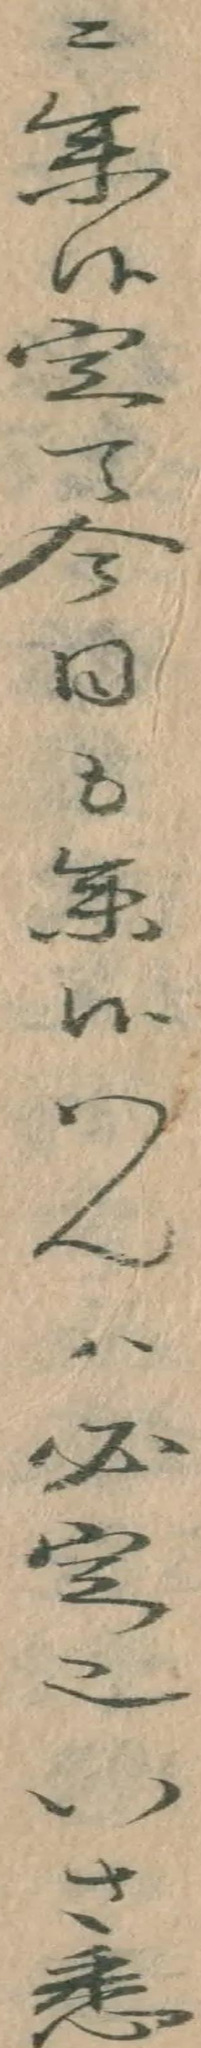に参候定て今日も参候はんは必定也いさ悉
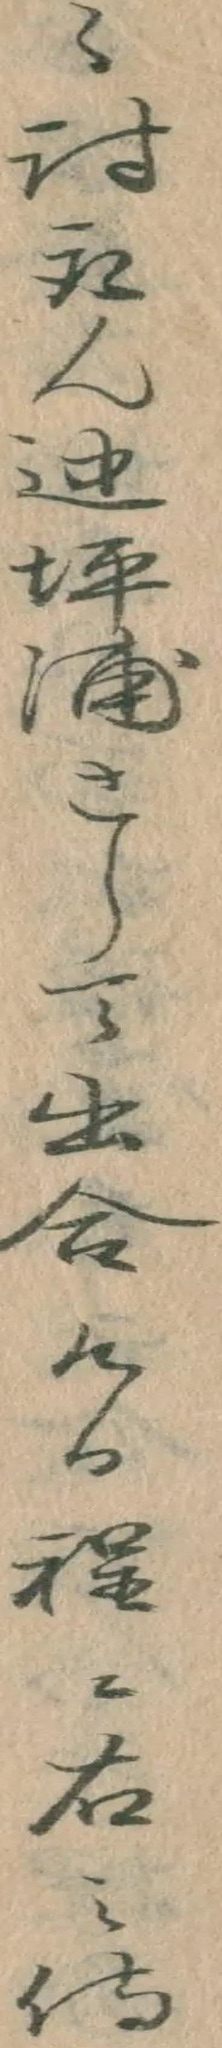く討取ん迚坪浦さして出合ける程に右之侍
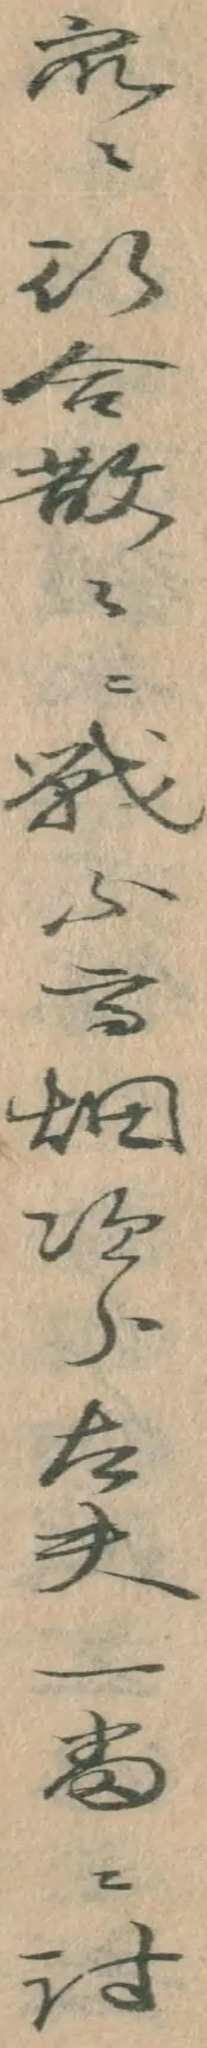衆に行合散々に戦ふ高畑次郎太夫一番に討
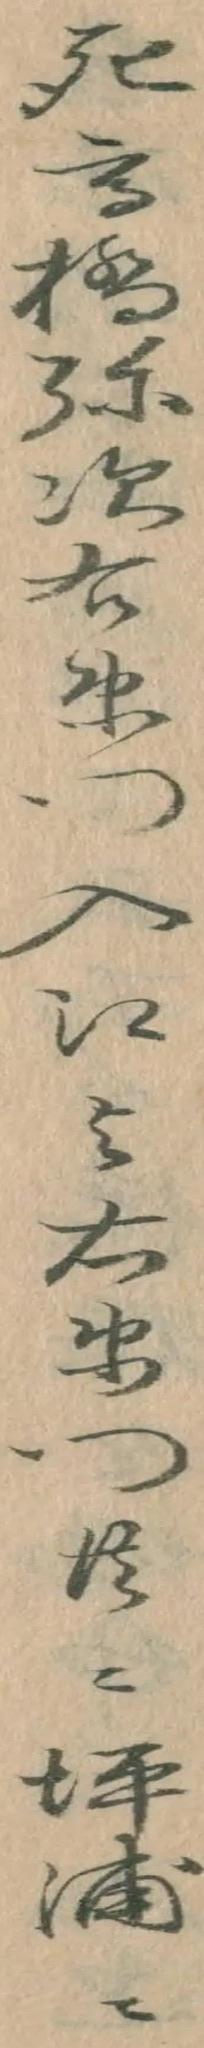死高橋弥次右衛門入江与右衛門共に坪浦に
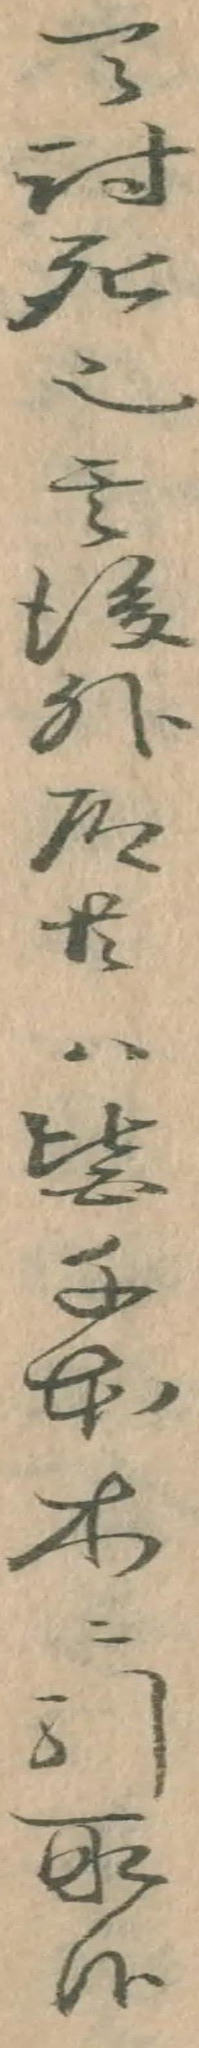て討死也其後外道共は皆千本木に引取候

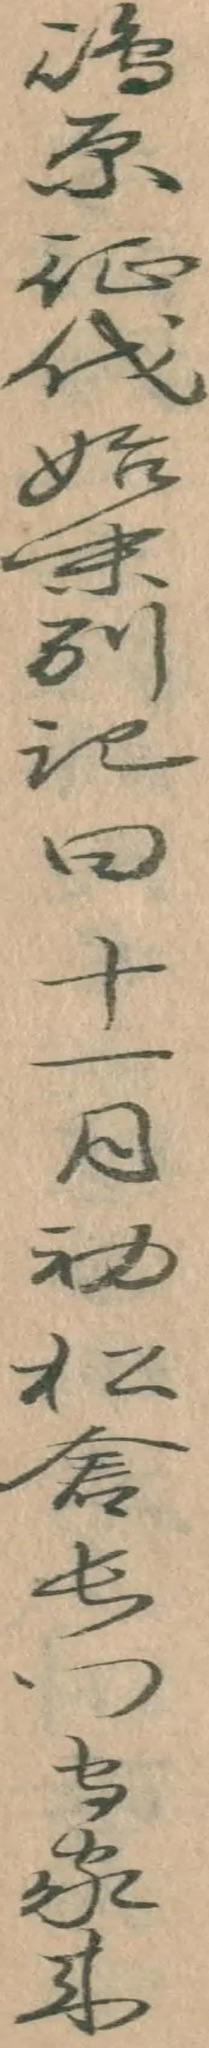島原征伐始末別記曰十一月初松倉長門守家来
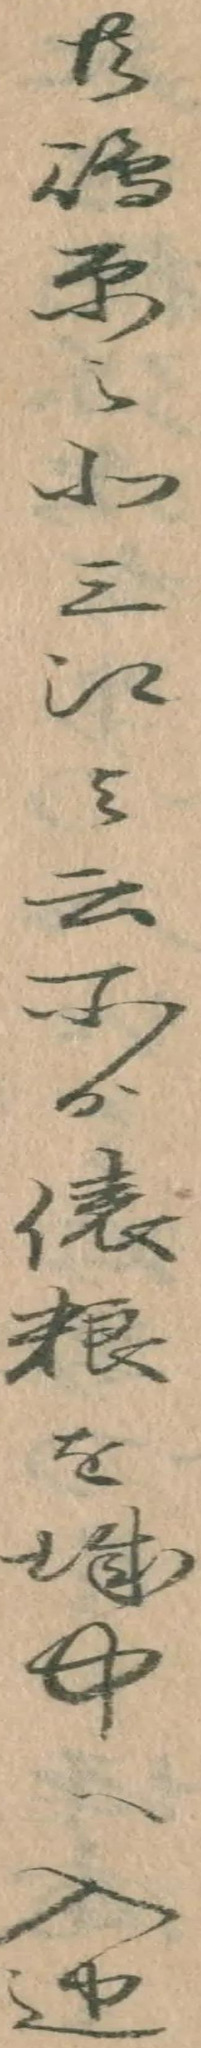共島原之北三江与云所ゟ俵粮を城中へ入迚
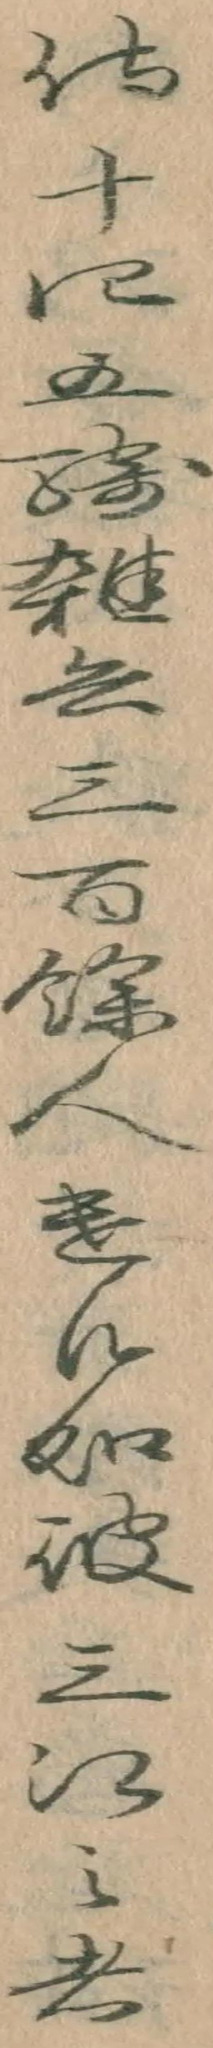侍十四五騎雑兵三百余人遣候処彼三江之者
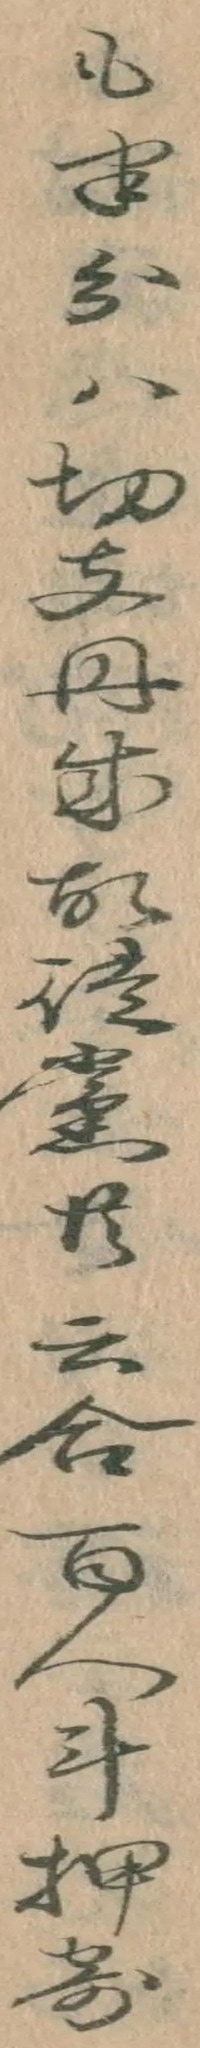も半分は切支丹成故徒党共云合百人斗押寄
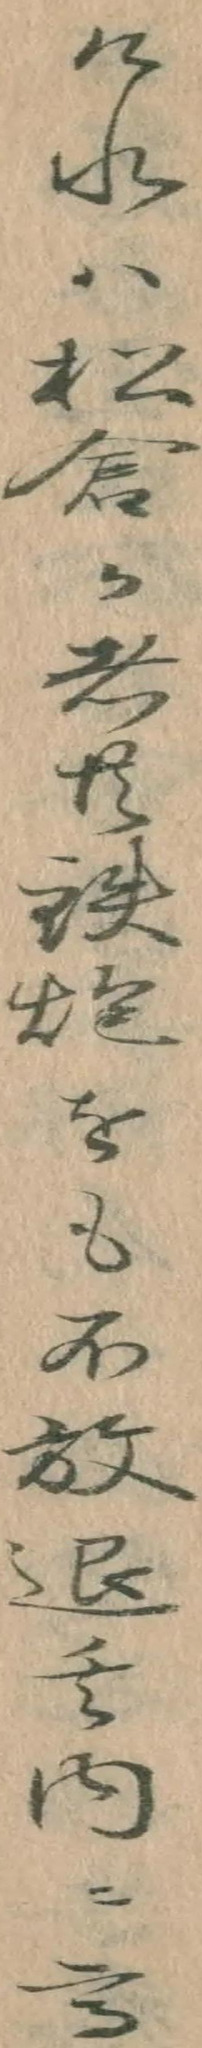けれは松倉か者共鉄炮をも不放退其内に高
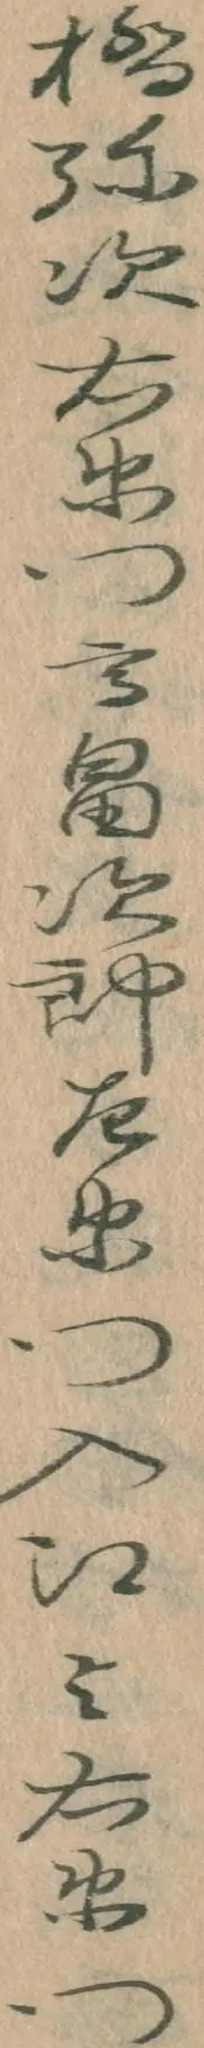橋弥次右衛門高畠次郎左衛門入江与右衛門
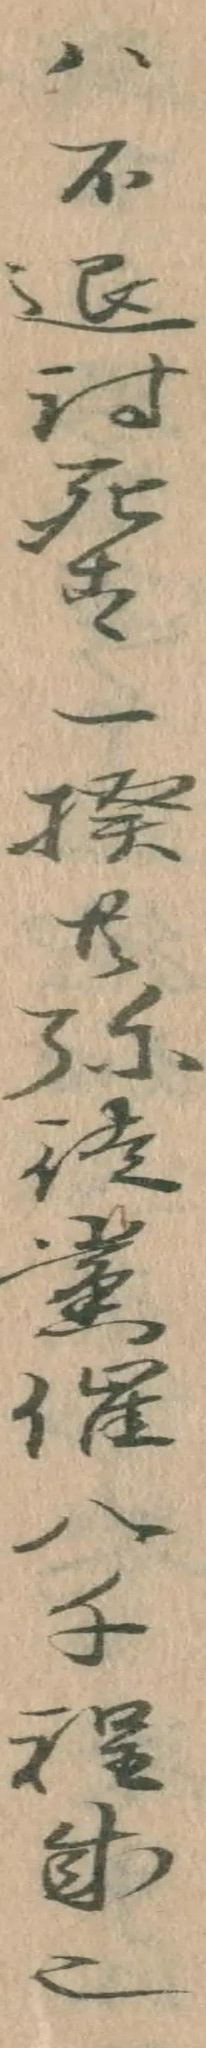は不退討死春一揆共弥徒党催八千程成也
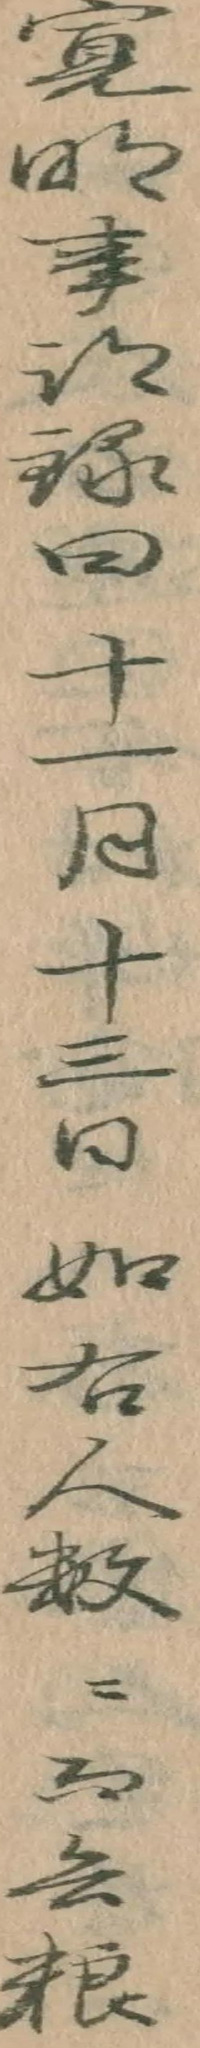寛明事跡録曰十一月十三日如右人数に而兵粮
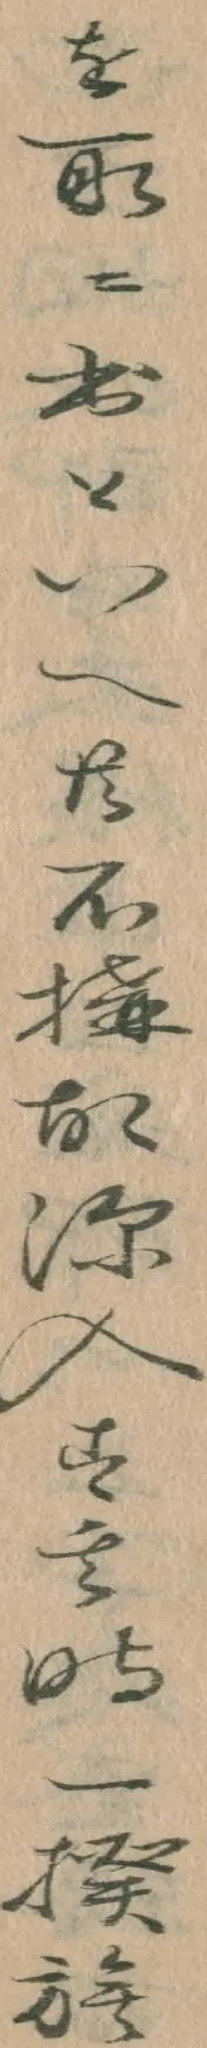を取に出といへ共不構故深入春其時一揆族
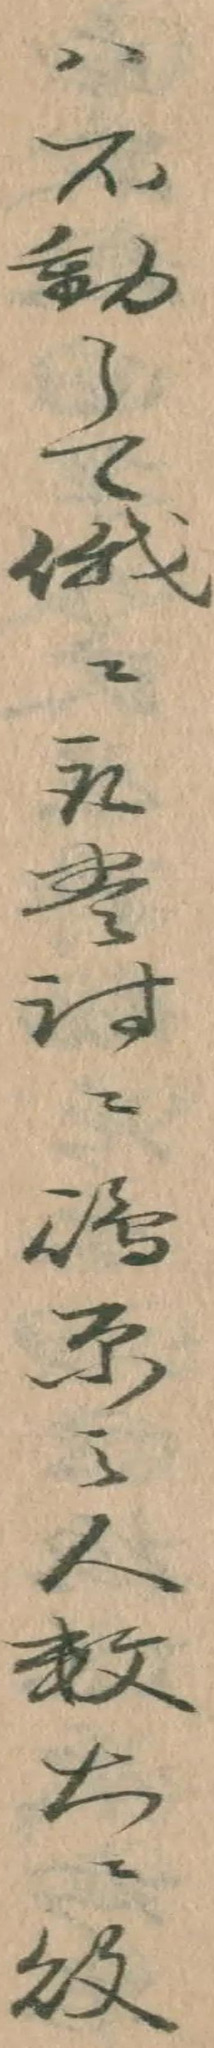は不動して俄に取巻討に島原之人数大に敗
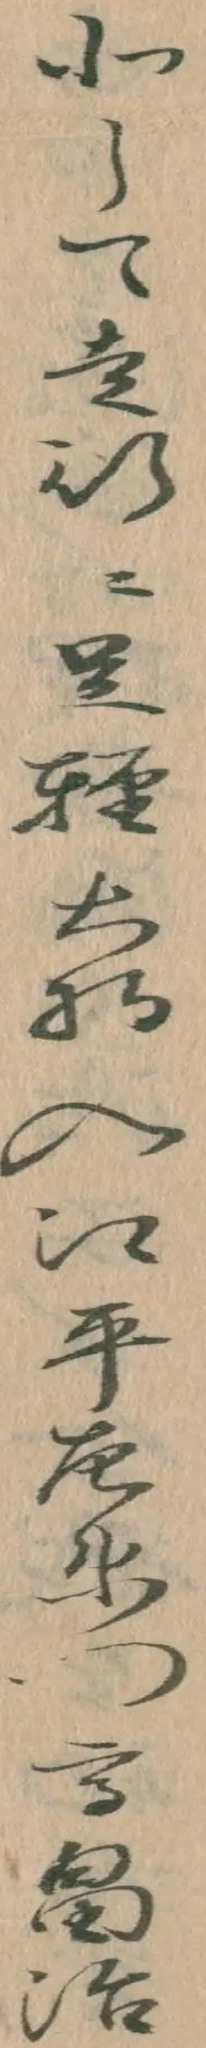北して走行に足軽大将入江平左衛門高畠治
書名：切支丹御退治記 49巻. [2]
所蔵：国立国会図書館 National Diet Library, JAPAN
